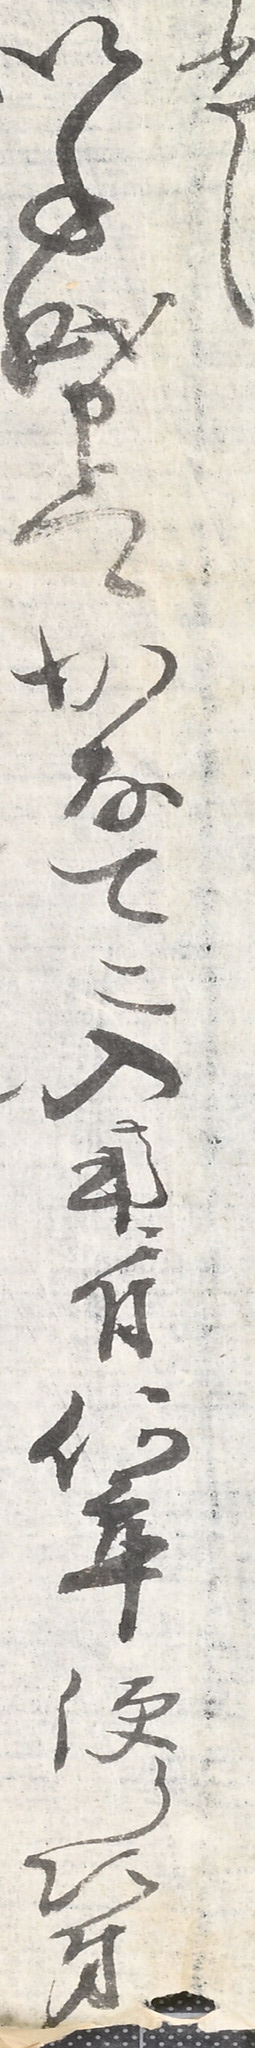以手紙申上候かなてこ入用に付何卒便り次第
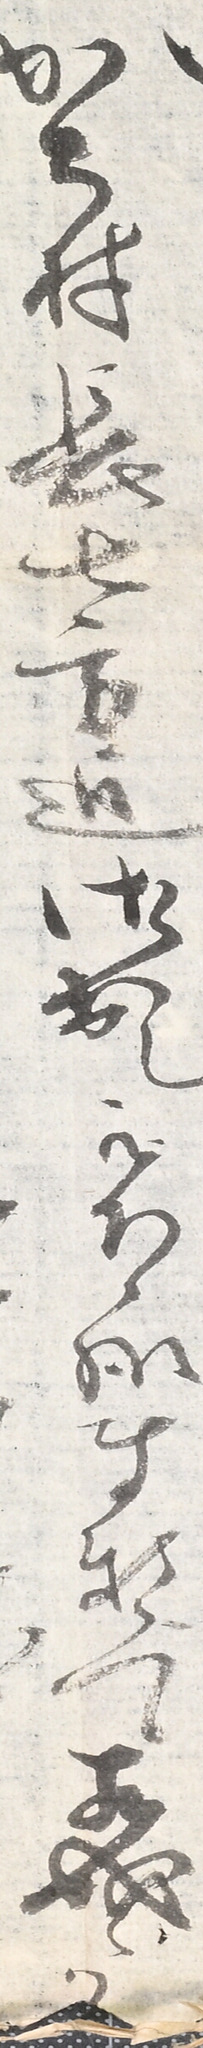かち村長七方迄御出し被下候様奉願上候相成候ハ
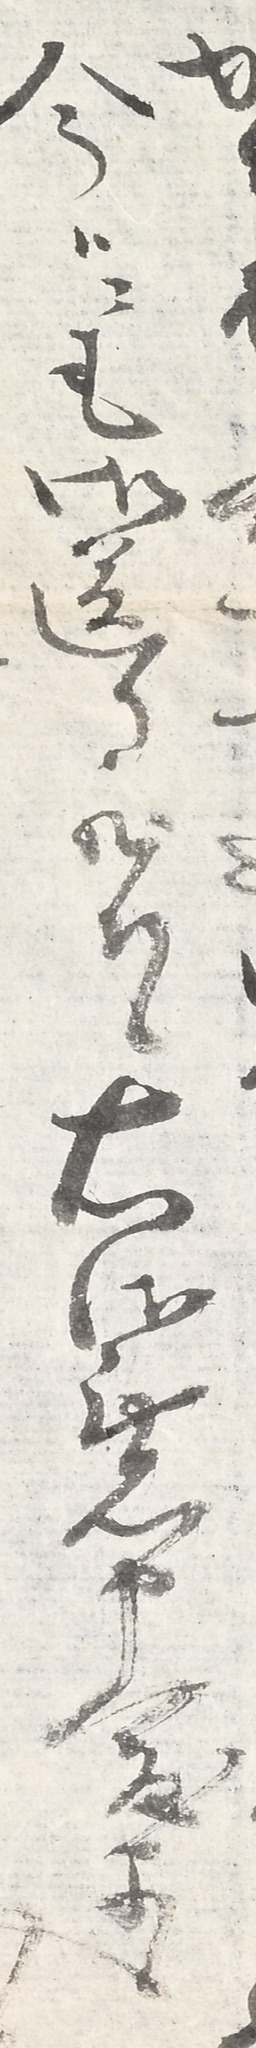今日にも御送り被下候右御無心申上度早々以上
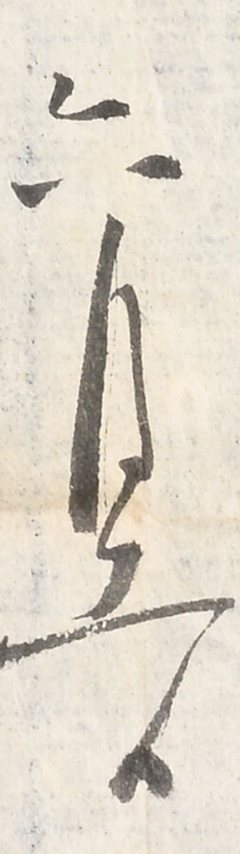六月十一日
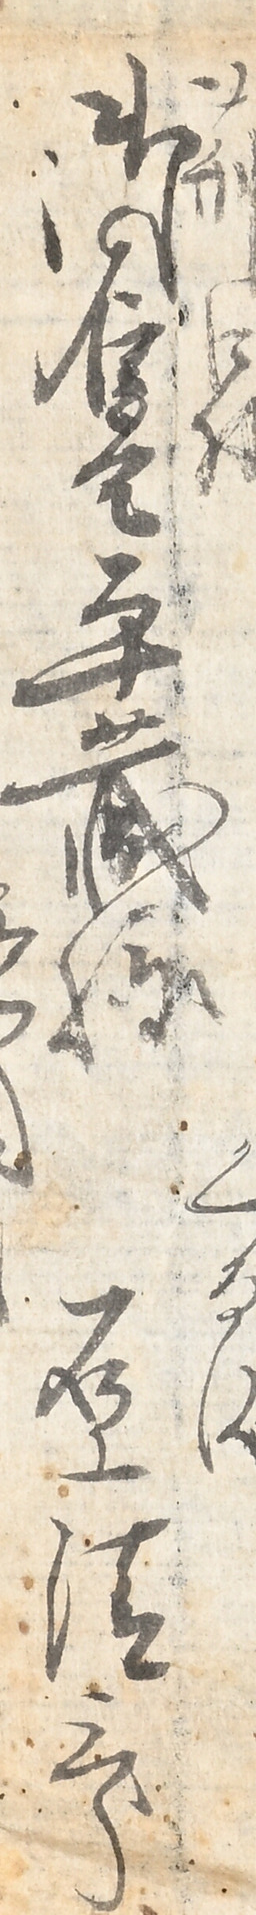御名主平蔵様石工清三郎
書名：（書状）
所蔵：伊那市立高遠町図書館・合同会社AMANE
